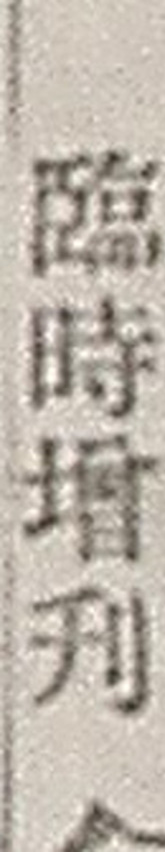臨時増刊
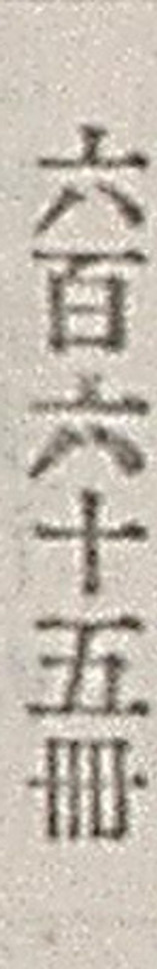六百六十五冊
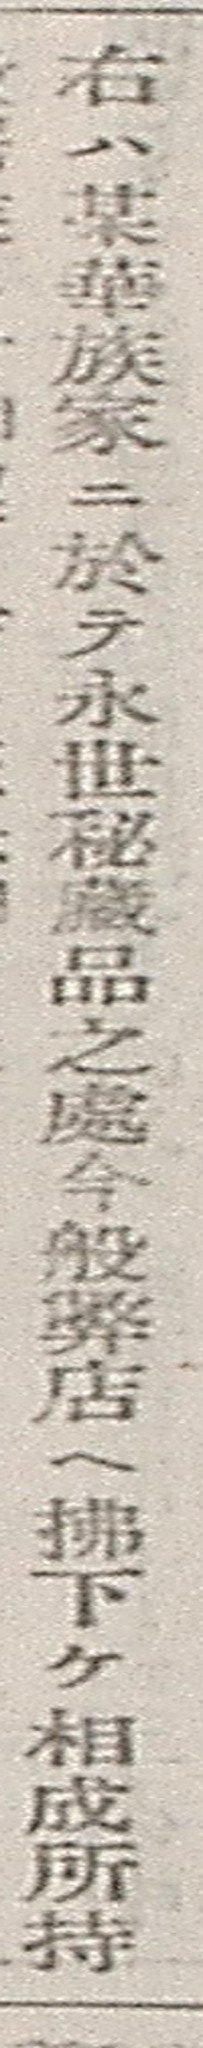右は某華族家に於て永世秘蔵品之処今般弊店へ拂下け相成所持
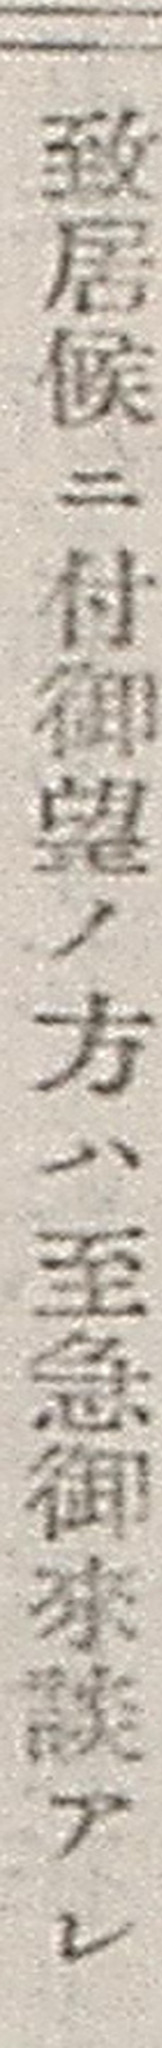致居候に付御望の方は至急御来談あれ
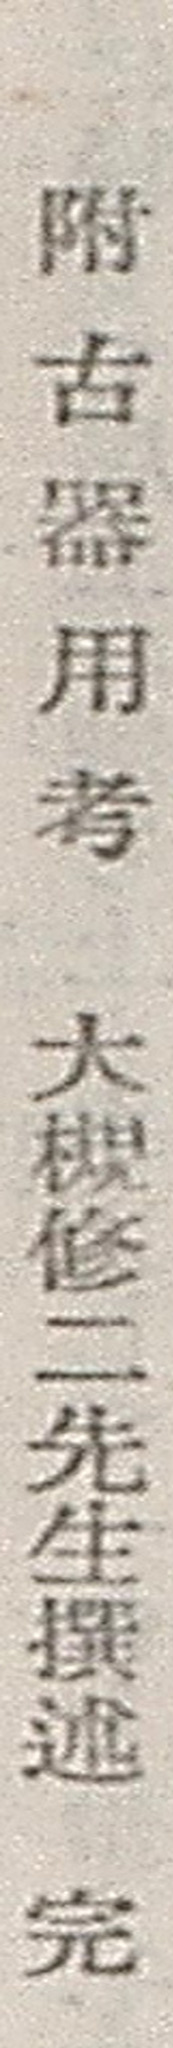附古器用考大槻修二先生撰述完
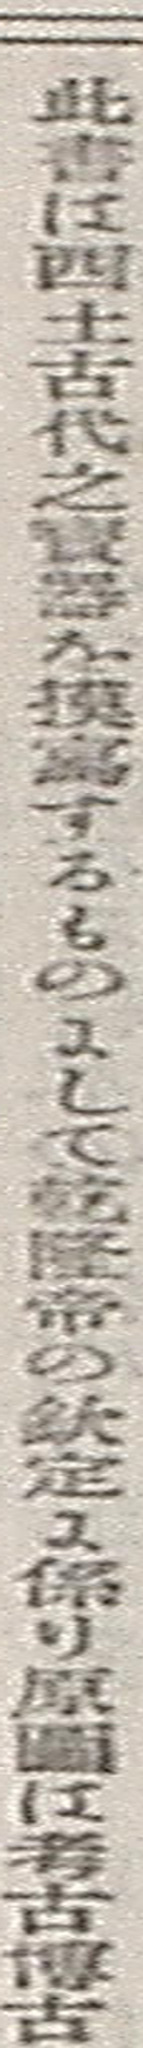此書は西土古代に寶器を模写するものにして乾隆帝の欽定に係り原圖は考博古の
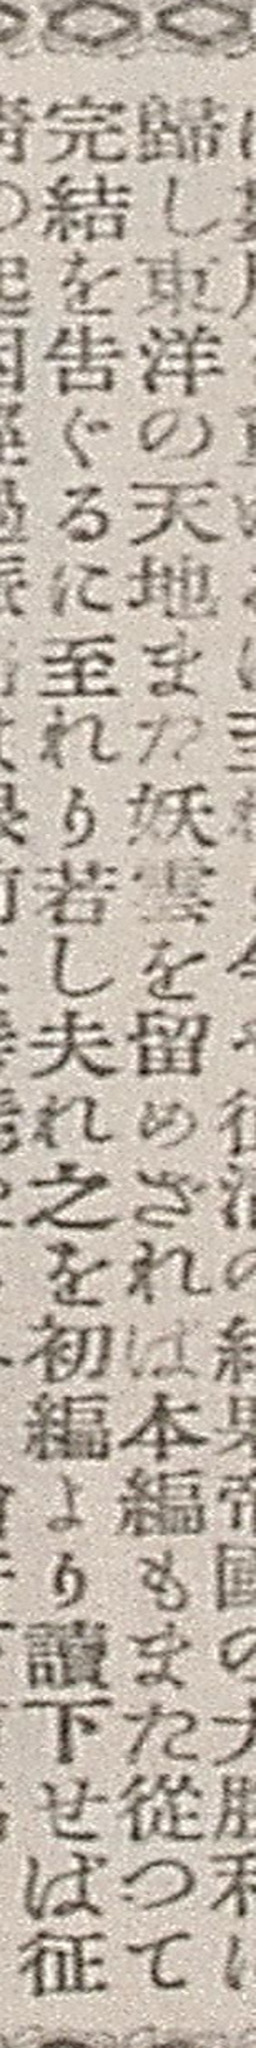完結を告ぐるに至れり若し夫れ之を初編より読下せば征
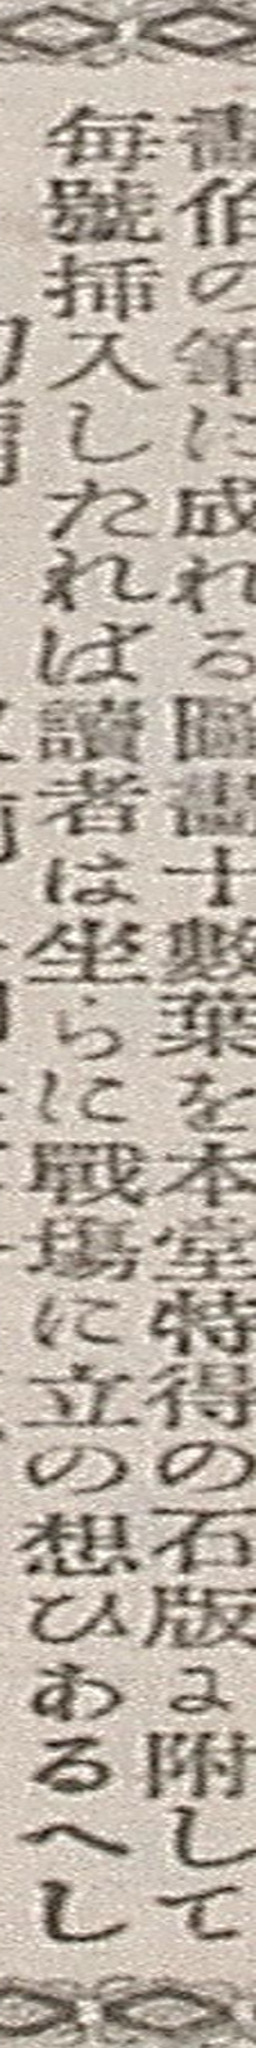毎号挿入したれば読者は坐らに戦場に立の想ひあるへし
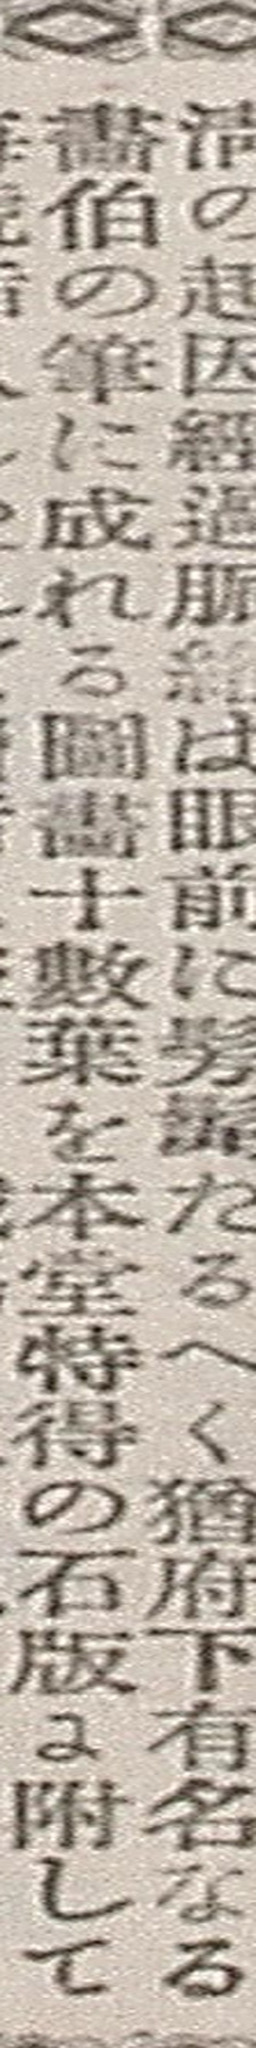畫伯の筆に成れる圖畫十数葉を本堂特得の石版に附して
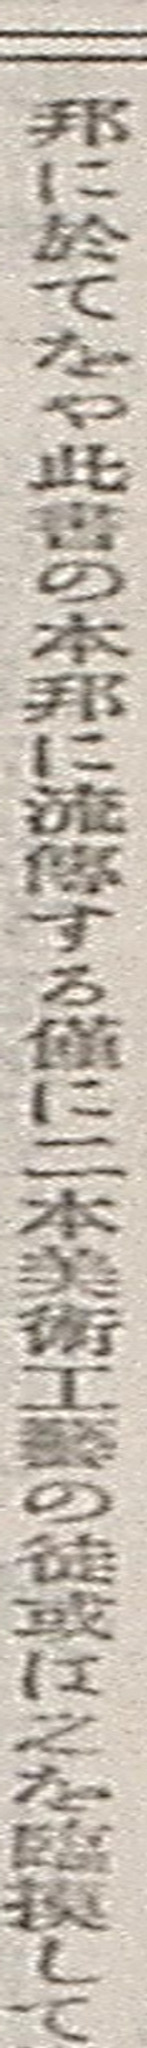邦に於てをや此書の本邦に流伝する僅に二本美術工芸の徒或は之を臨模して伝ふと
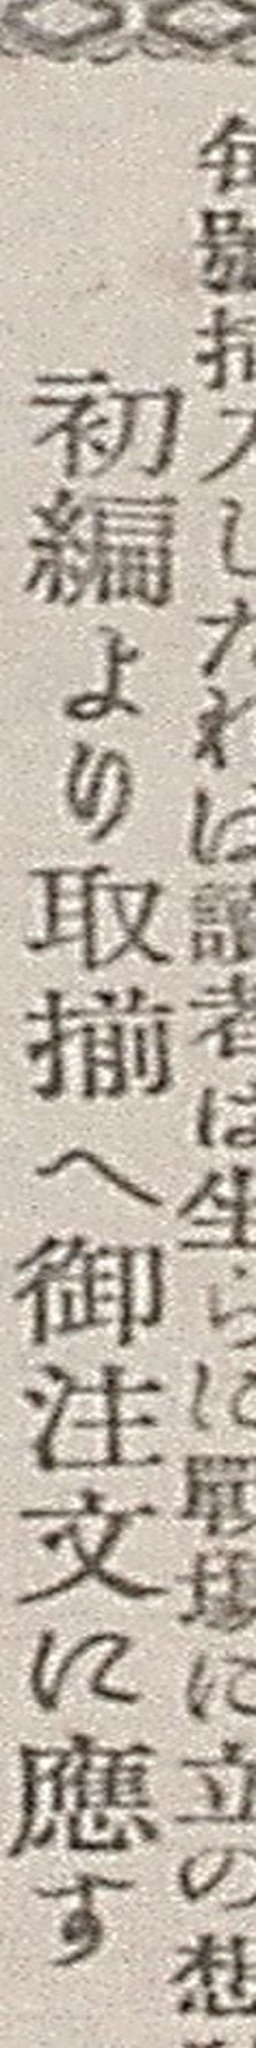初編より取揃へ御注文に応す
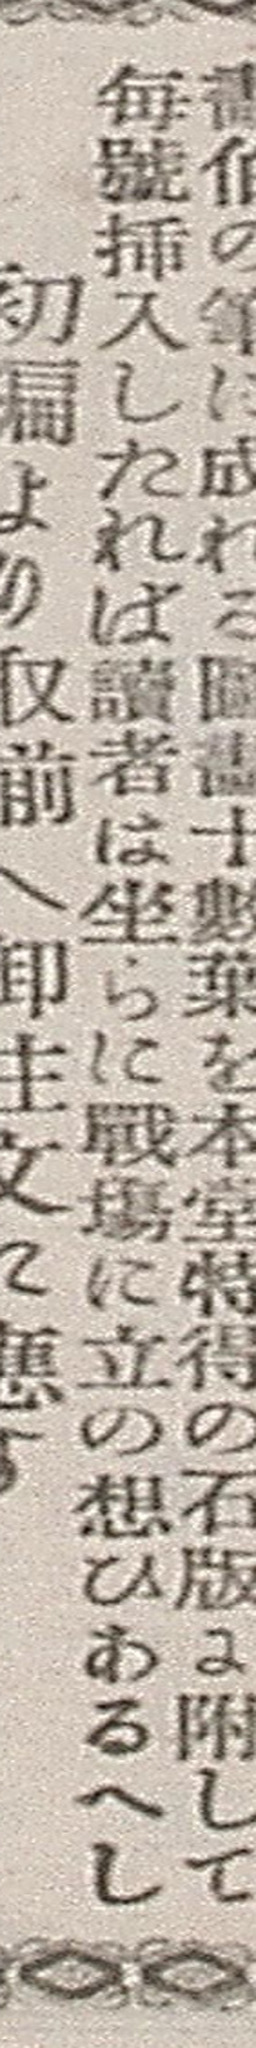毎号挿入したれば読者は坐らに戦場に立の想ひあるへし
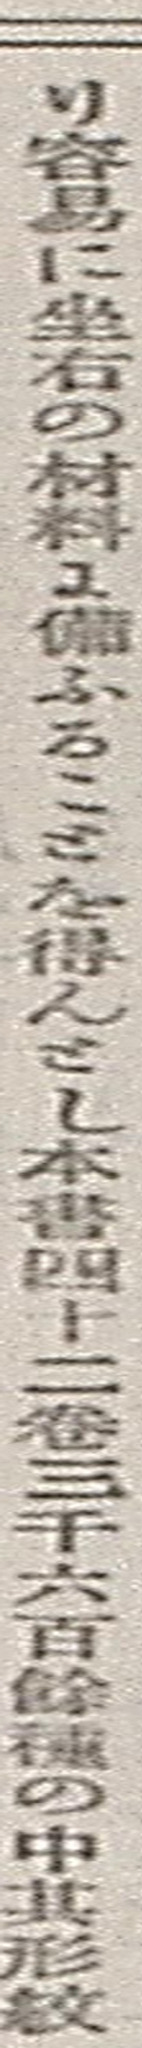り容易に坐右の材料に備ふることを得んとし本書四十二巻三千六百餘種の中其形紋
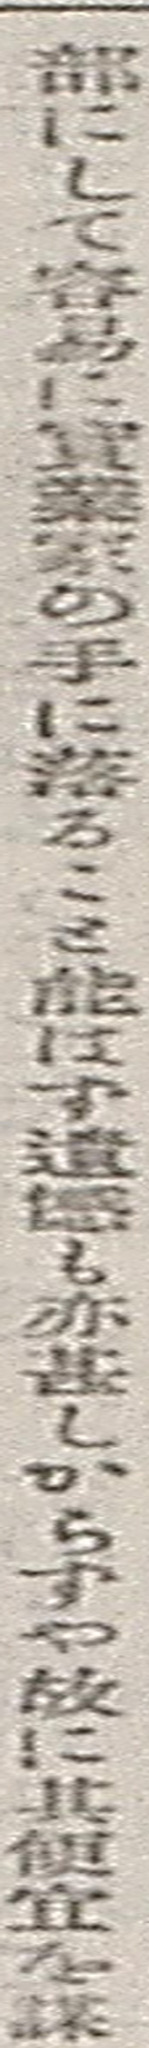部にして容易に実業家の手に落ること能はず遺憾も亦甚しからずや故に其便宜を某
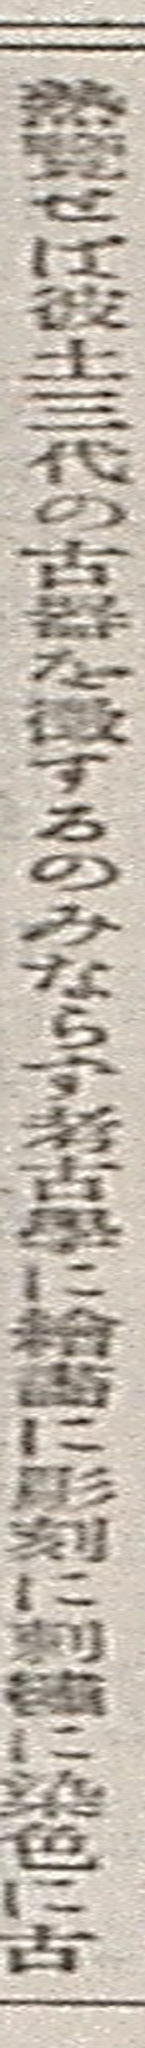熟覧せば彼土三代の古器を徴するにみならず考古学に絵画に彫刻に刺繍に染色に古
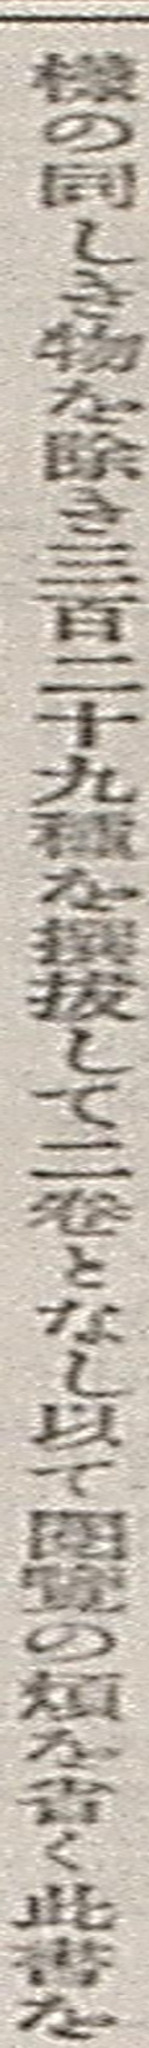様の同しき物を除き三百二十九種を選抜して二巻となし以て閲覧の煩を省く此書を
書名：風俗畫報臨時増刊第百二十六號　洪水被害録（中）
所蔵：東京大学地震研究所図書室 Earthquake Research Institute Library, The University of Tokyo, JAPAN
